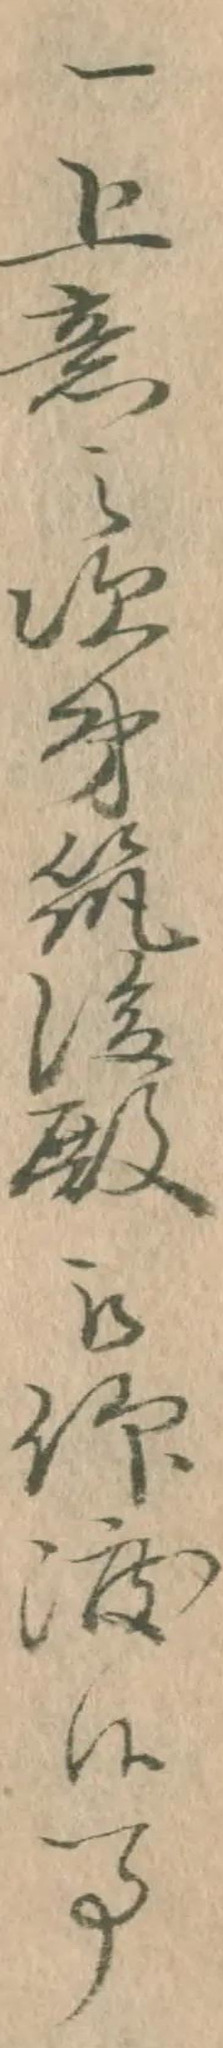一上意之次第筑後殿被仰渡候事
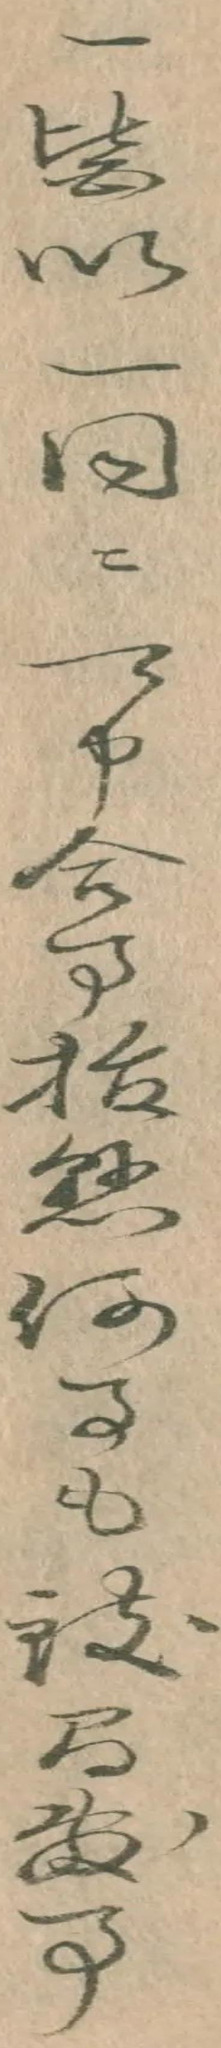一皆以一同に可申合事抜懸何事も致間敷事
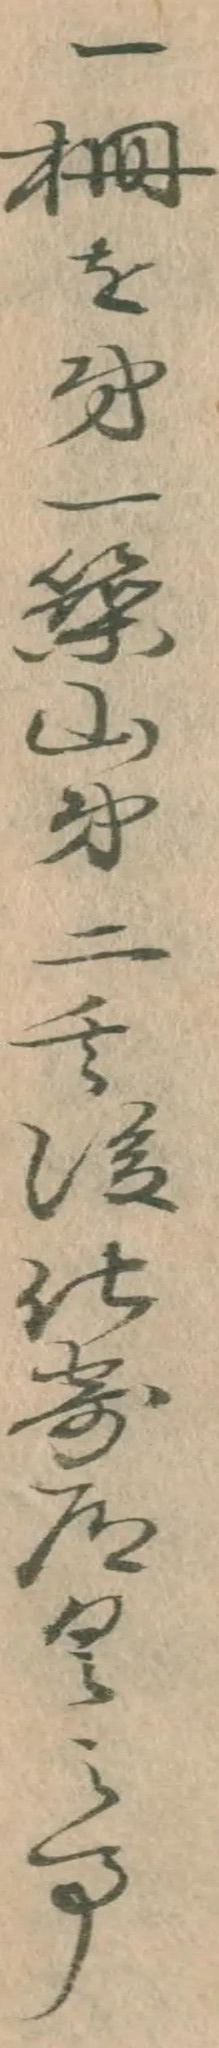一柵を第一築山第二其後仕寄道具之事
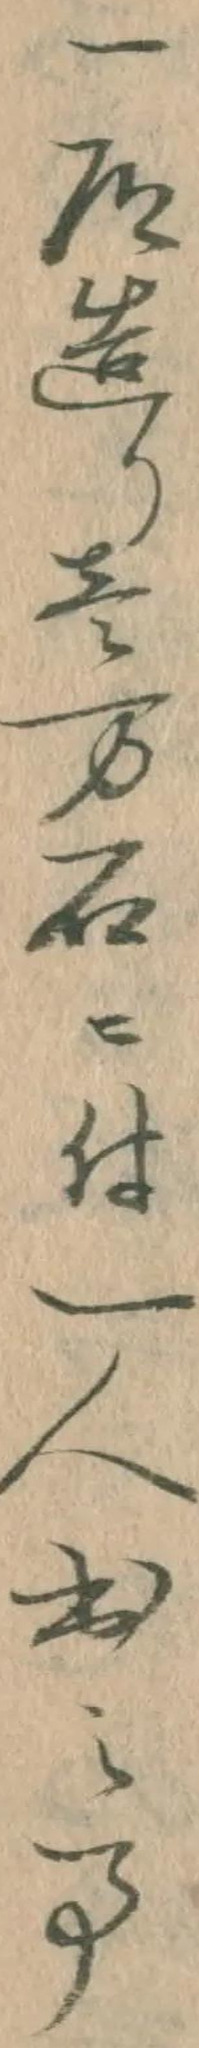一道造り壱万石に付一人出之事
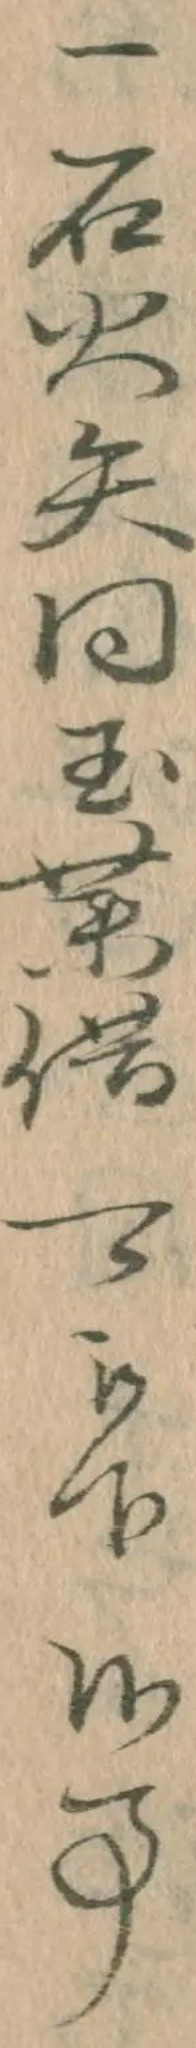一石火矢同玉薬借可被下候事
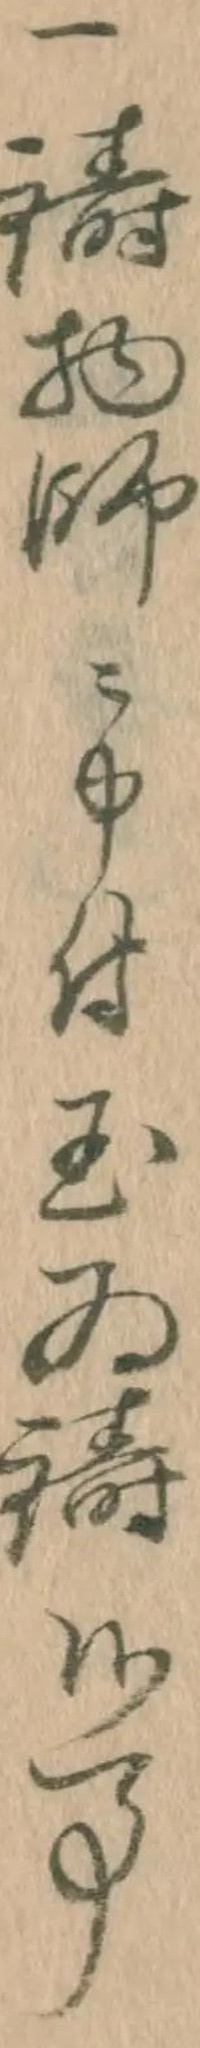一鋳物師に申付玉ゐ鋳候事
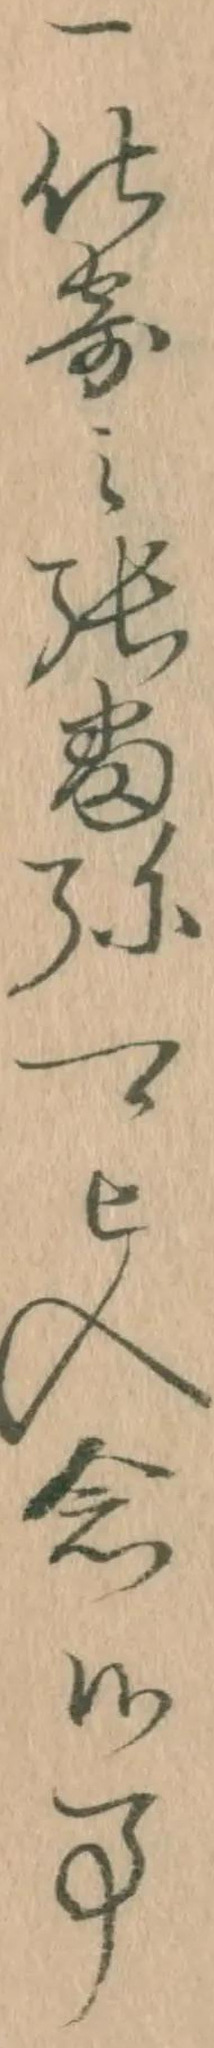一仕寄之張番弥可被入念候事
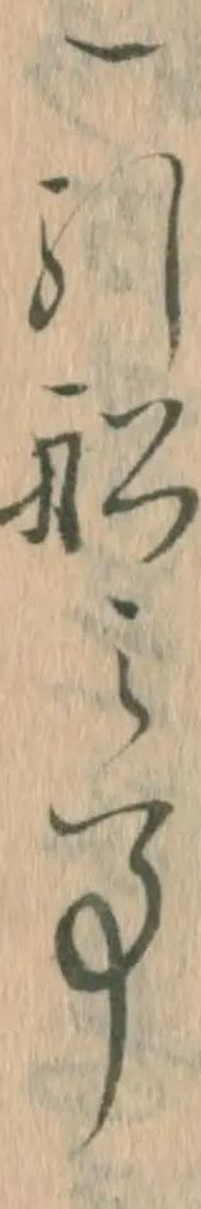一引舩之事
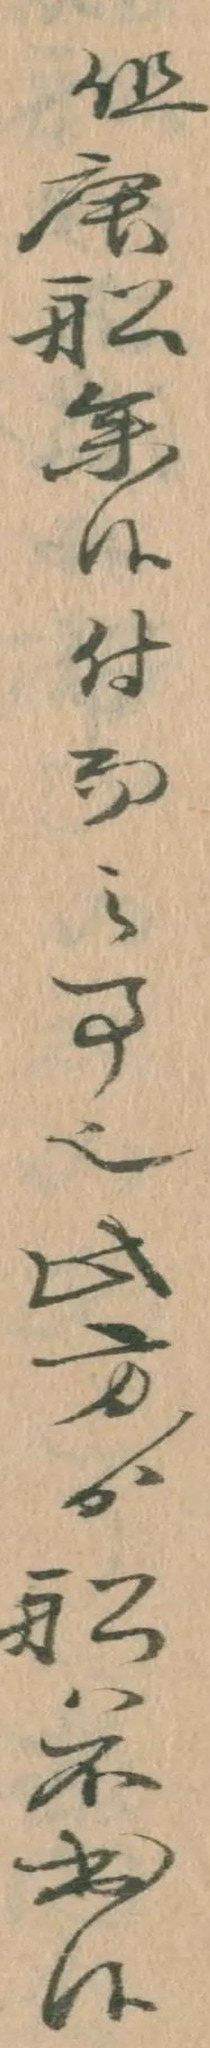但唐船参候付而之事也此方ゟ舩は不出候
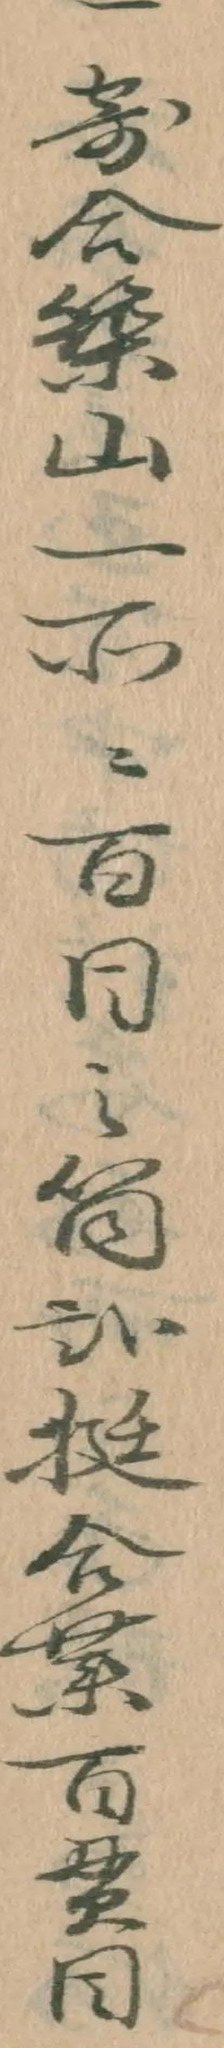一寄合築山一所に百目之筒弐挺合薬百貫目
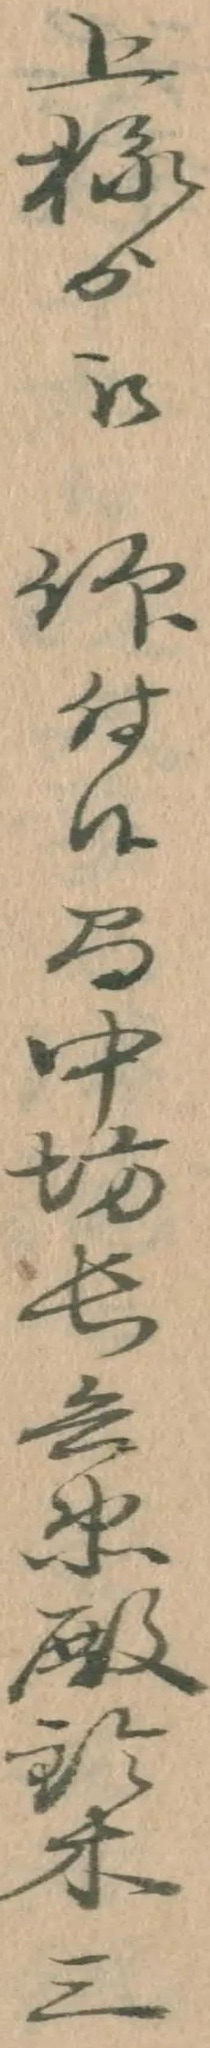上様ゟ被仰付候間中坊長兵衛殿鈴木三
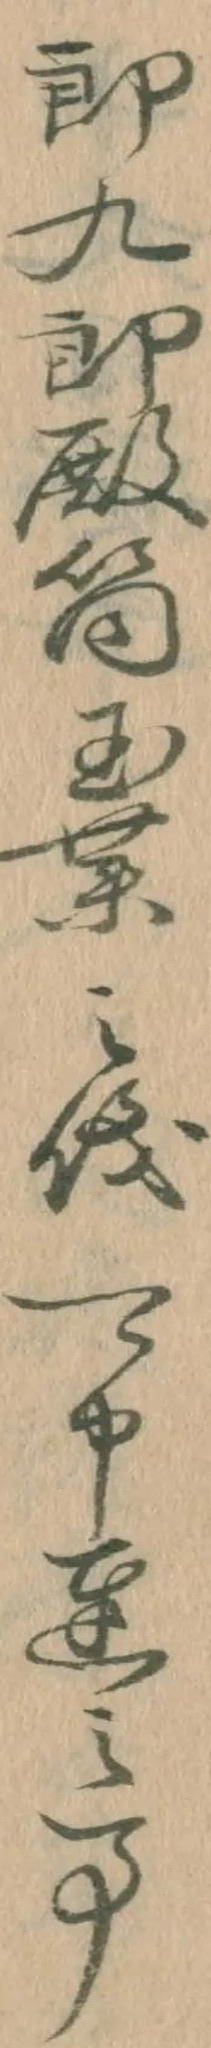郎九郎殿筒玉薬之儀可申達之事
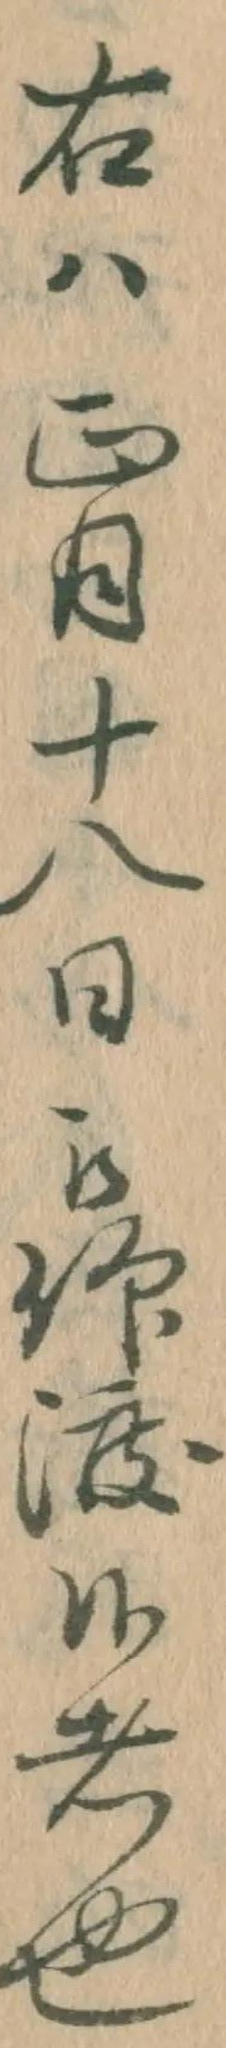右は正月十八日被仰渡候者也
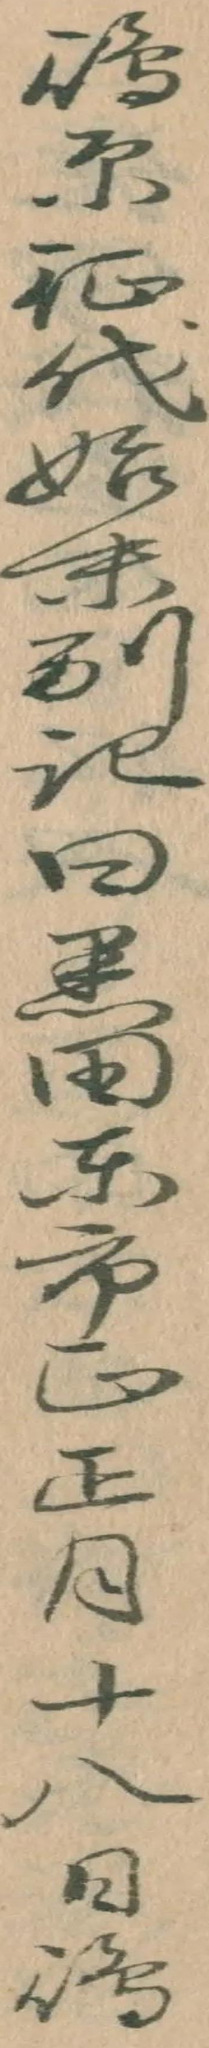島原征伐始末別記曰黒田東市正正月十八日島
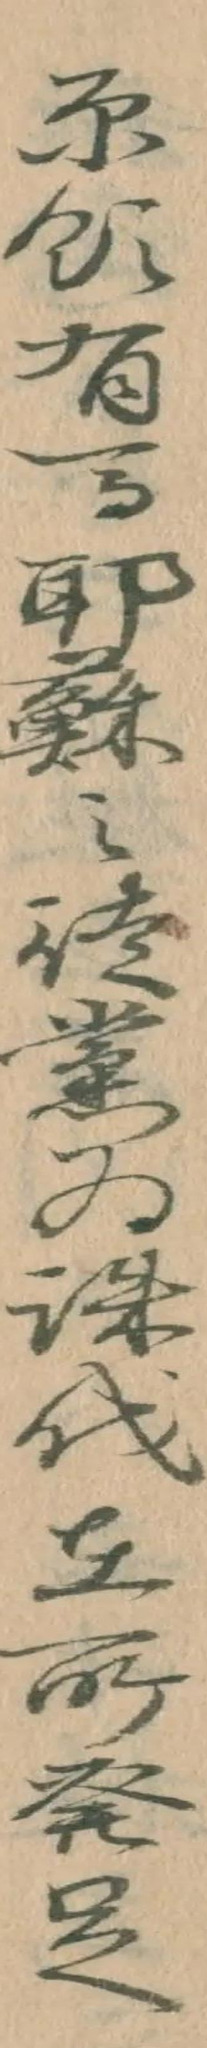原領有馬耶蘇之徒党ゐ誅伐在所発足
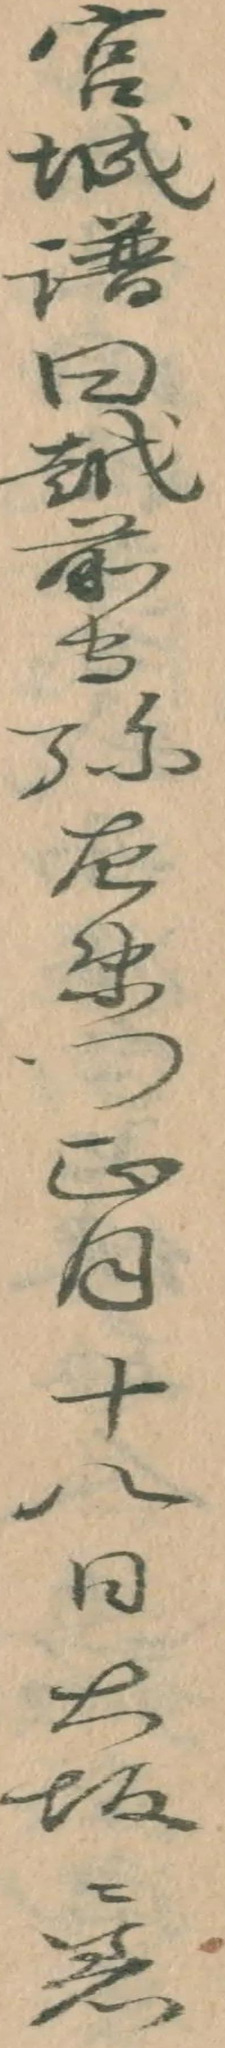宮城譜曰越前守弥左衛門正月十八日大坂に着
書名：切支丹御退治記 49巻. [6]
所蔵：国立国会図書館 National Diet Library, JAPAN
